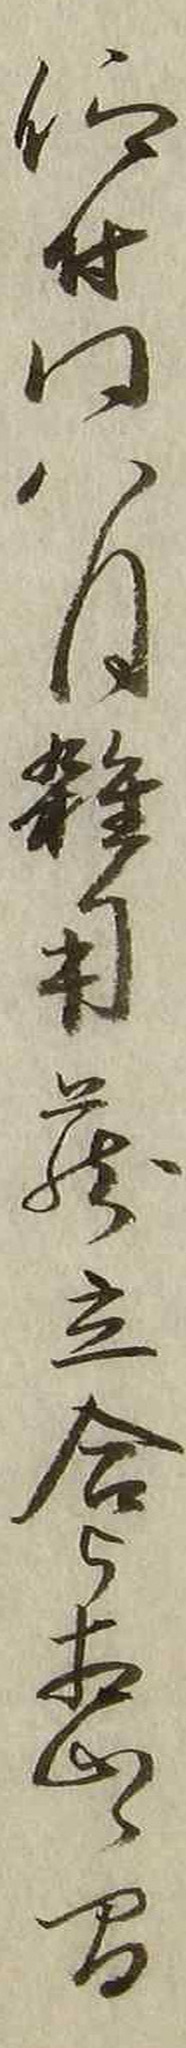仰付同八月雑用蔵立合被相止候間
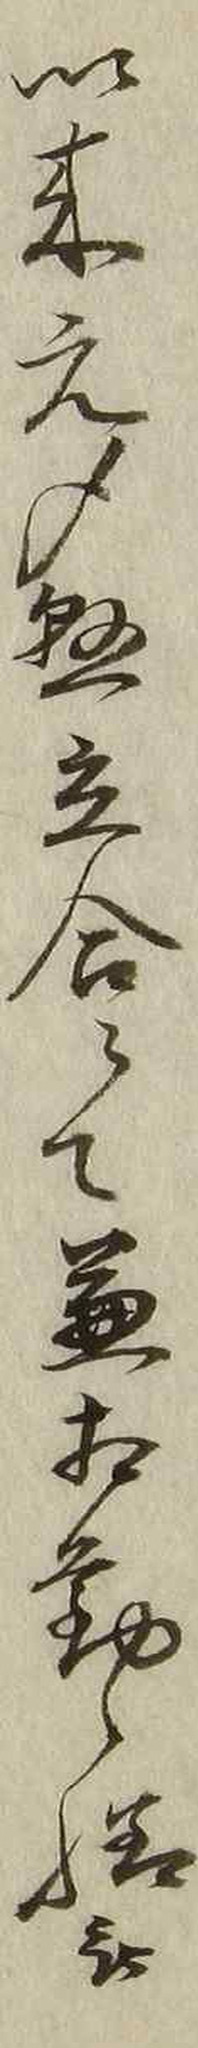以来元〆懸立合ニて兼相勤候様被
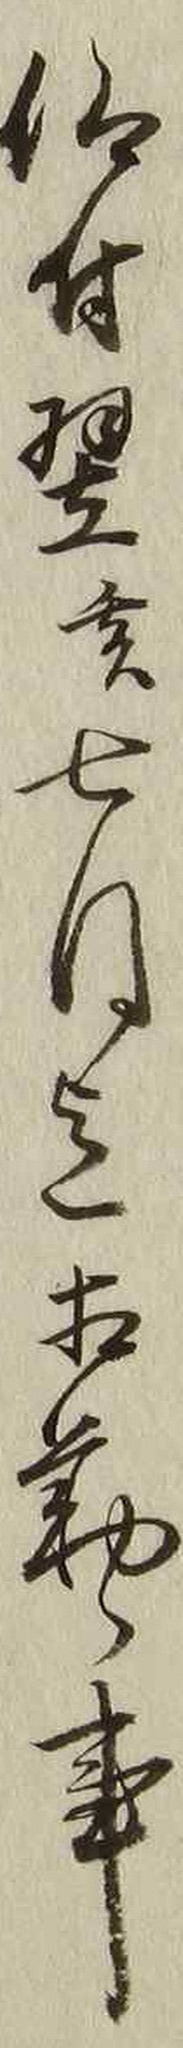仰付翌亥七月迄相勤候事
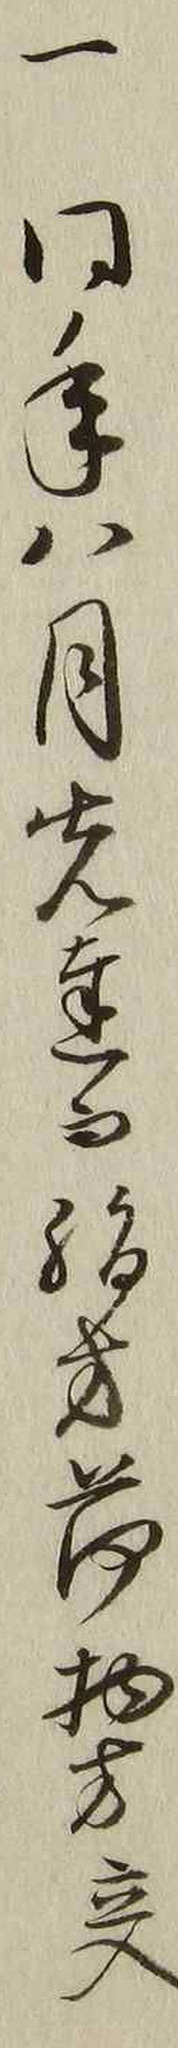一同年八月先達而絹方荷物方立入
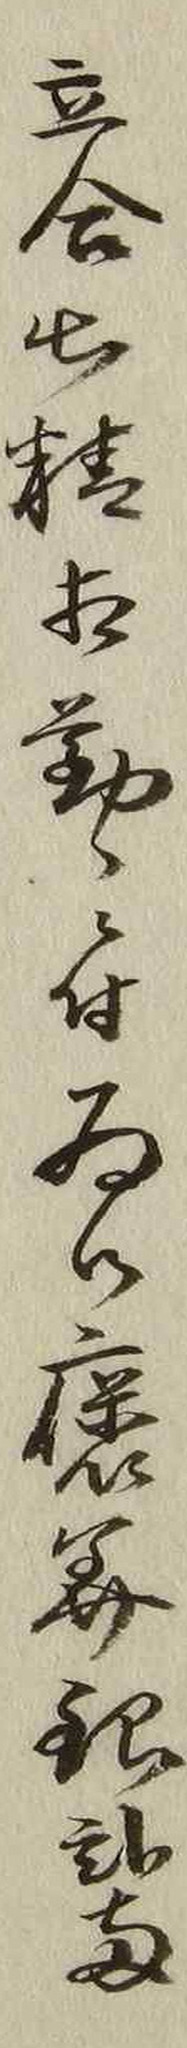立合出精相勤候ニ付為御褒美銀弐両
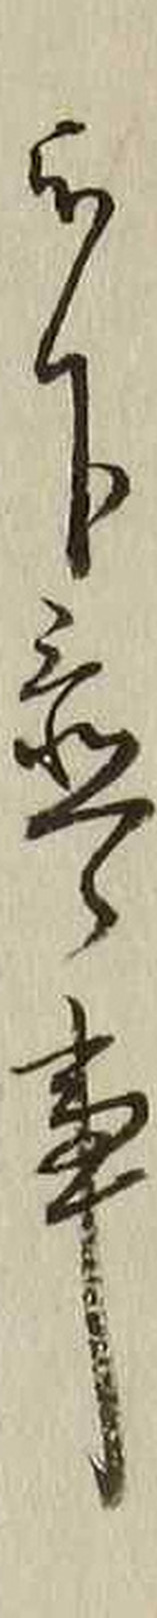被下置候事
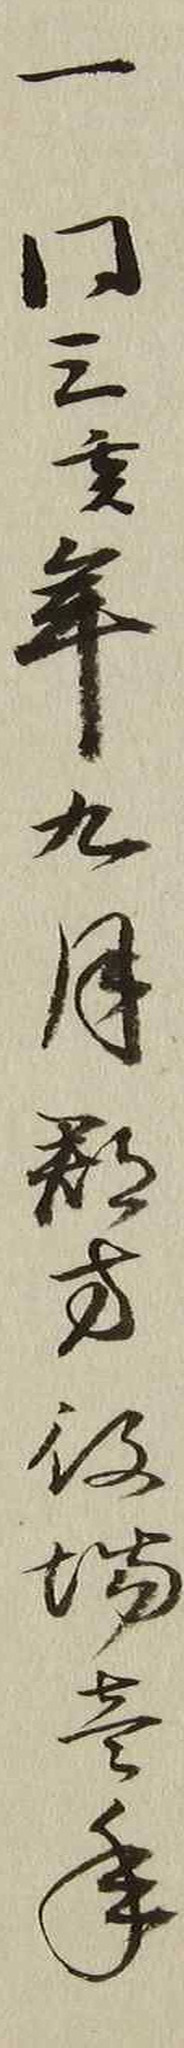一同三亥年九月郡方役場壱年
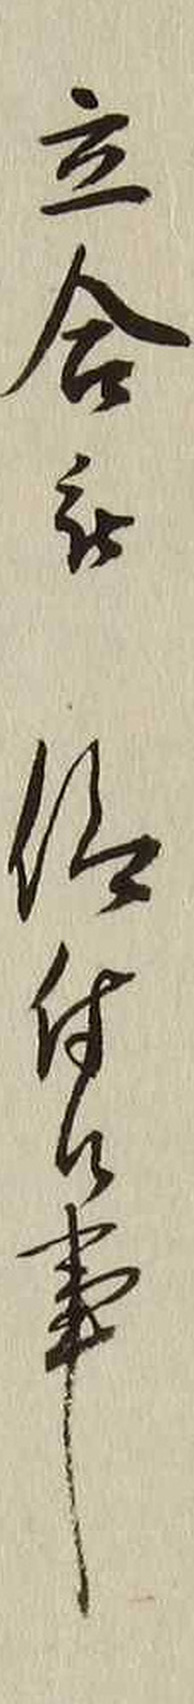立合被仰付候事
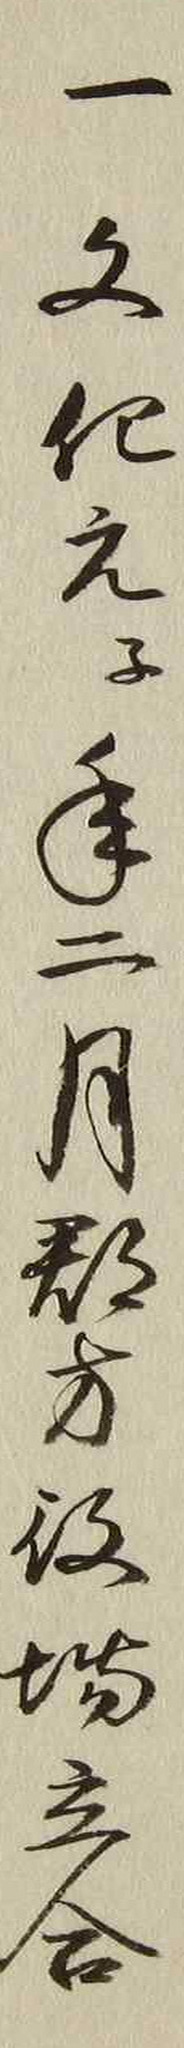一文化元子年二月郡方役場立合
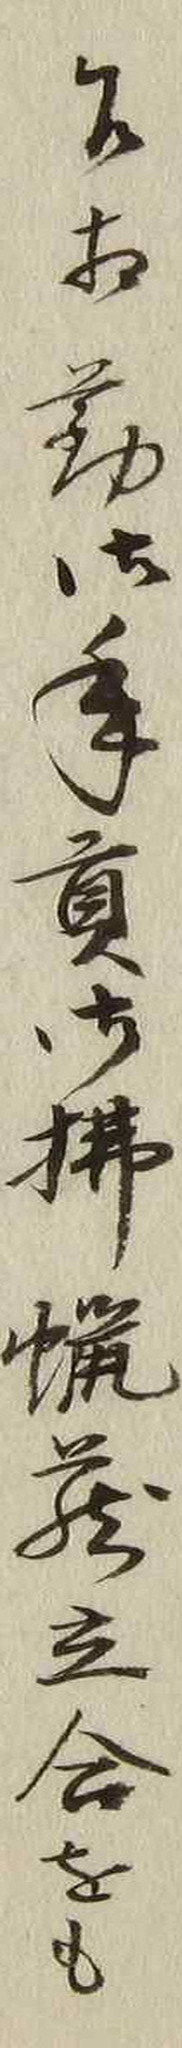乍相勤御年貢御払蝋蔵立合をも
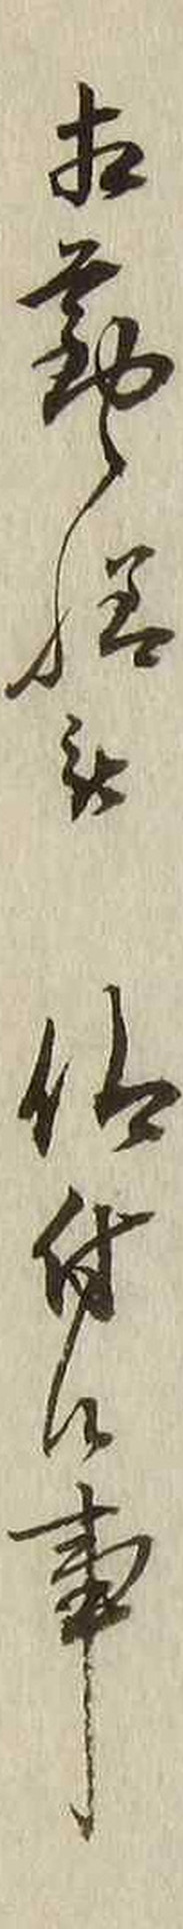相勤候様被仰付候事
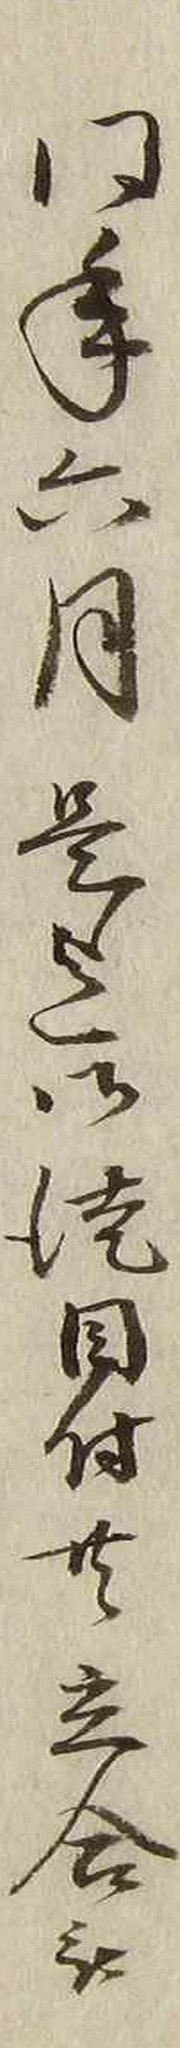一同年六月是迄御徒目付共立合被
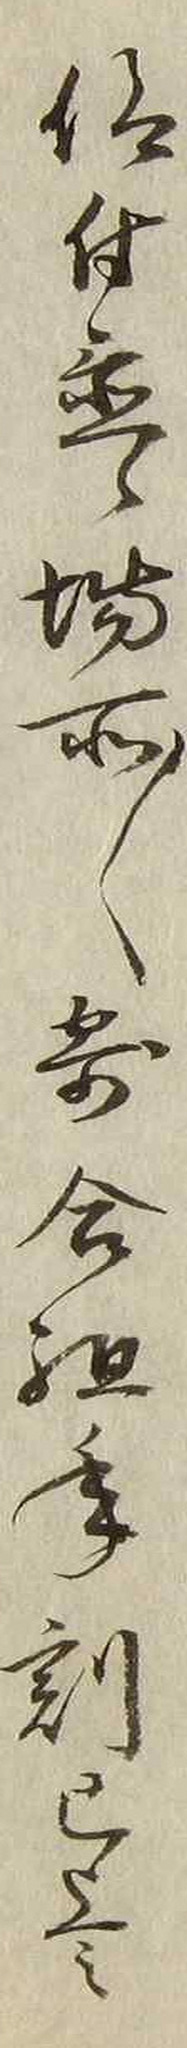仰付置候場所〳〵寄合組年割已上之
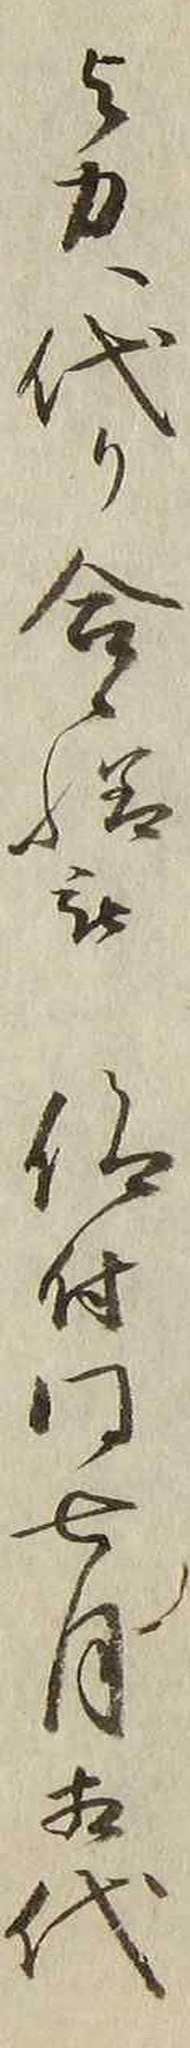与力へ代り合候様被仰付同七月相代
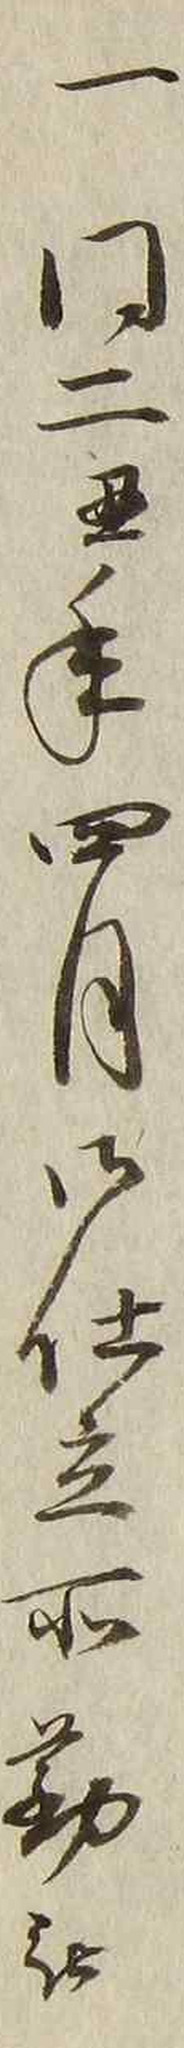一同二丑年四月御仕立所勤被
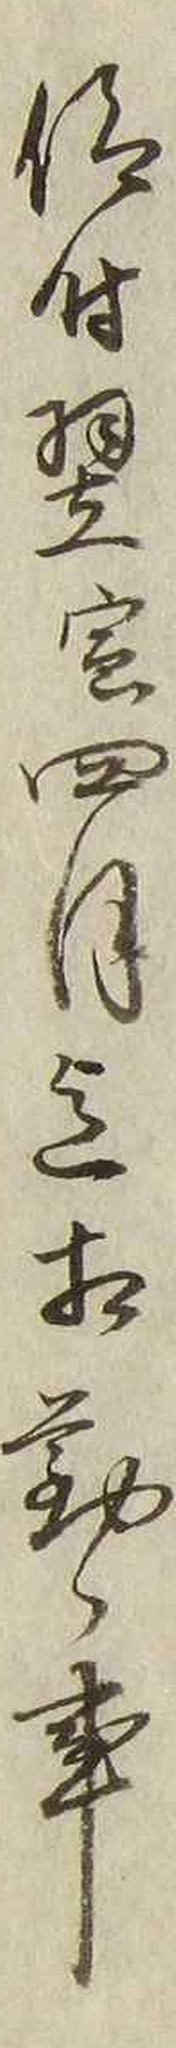仰付翌寅四月迄相勤候事
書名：諸士系譜　巻之102　か之部10
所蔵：会津若松市立会津図書館
